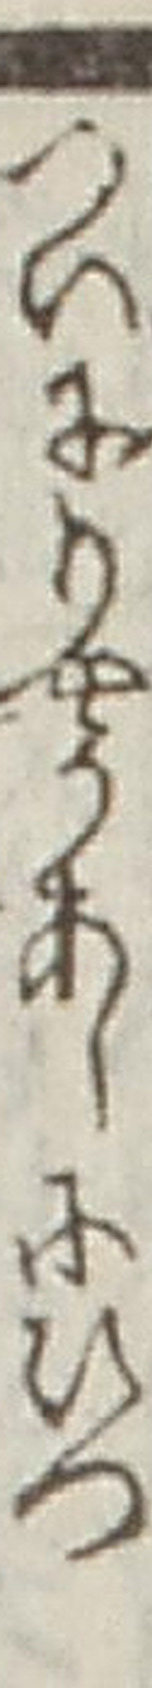ついにりやうあしにいつ
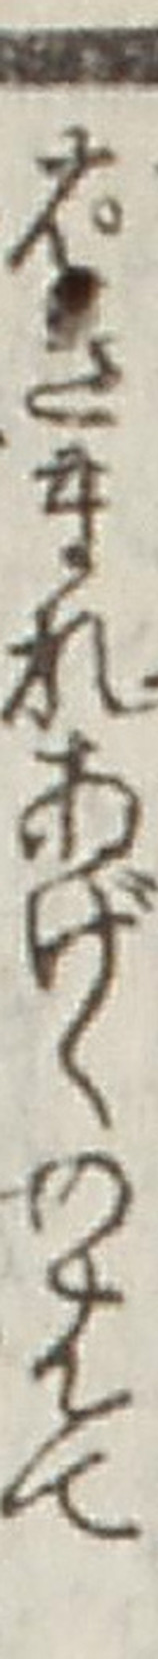ぱさまれあげくのはて
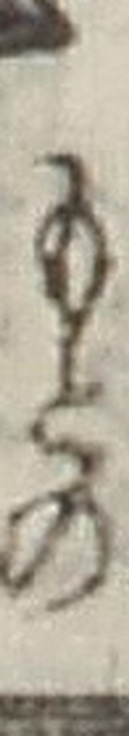もとの
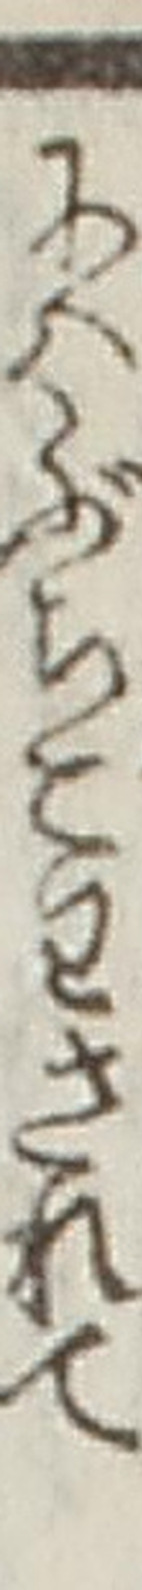にはぶちこわされて
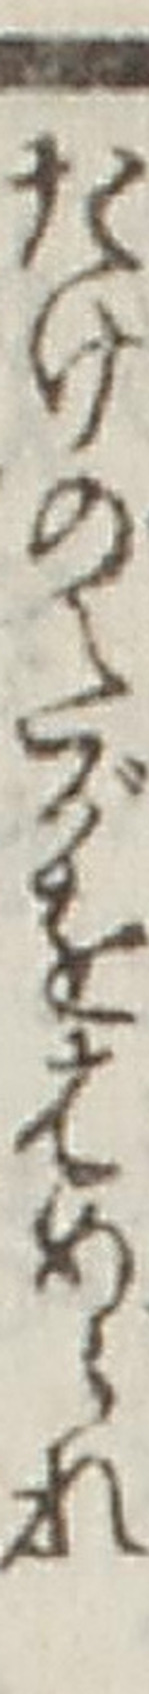おけのたがをはめられ
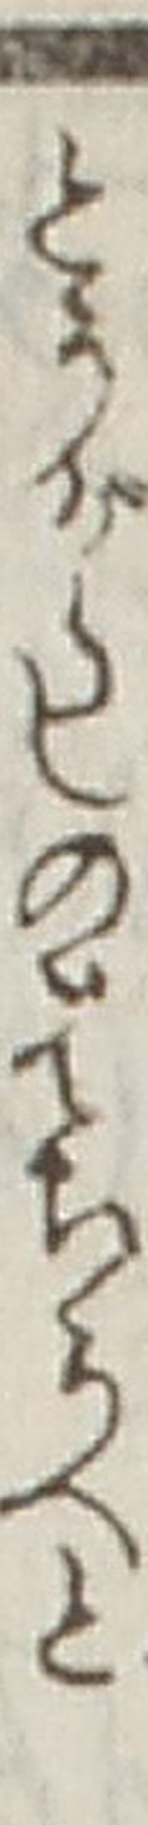とうがらしのはちうへと
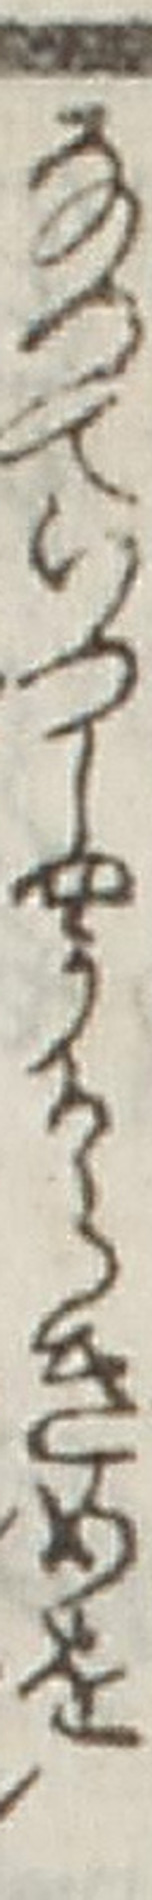なつていつしやうつらきめを
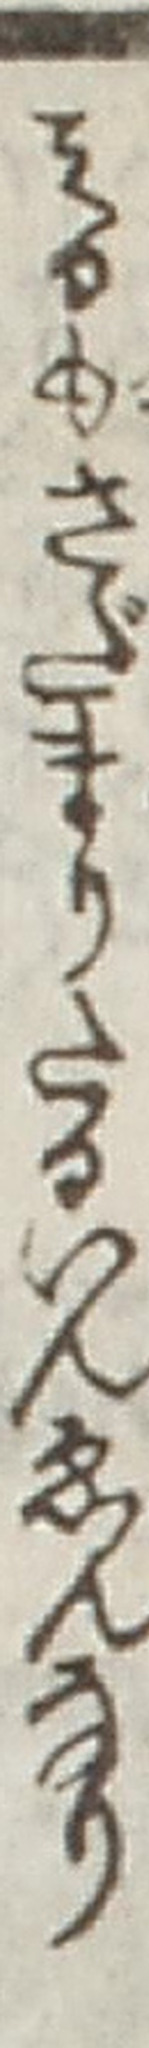みるもさだまりたるいんゑんなり
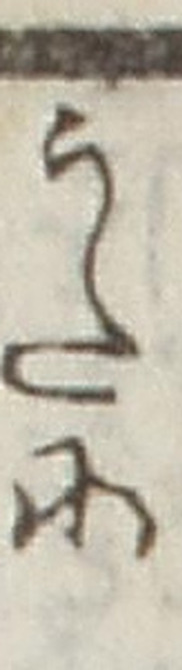うたに
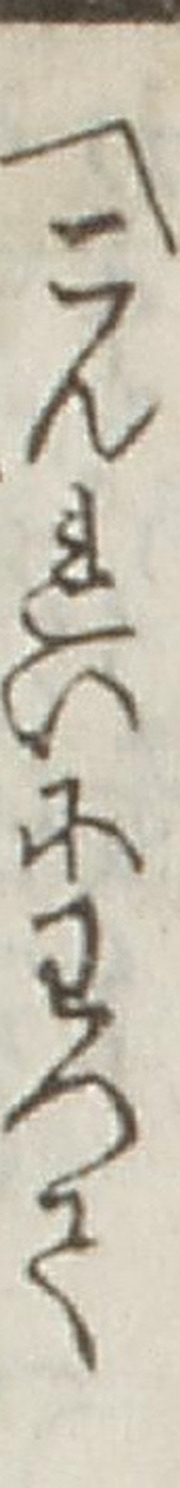〽こんれいにわつて
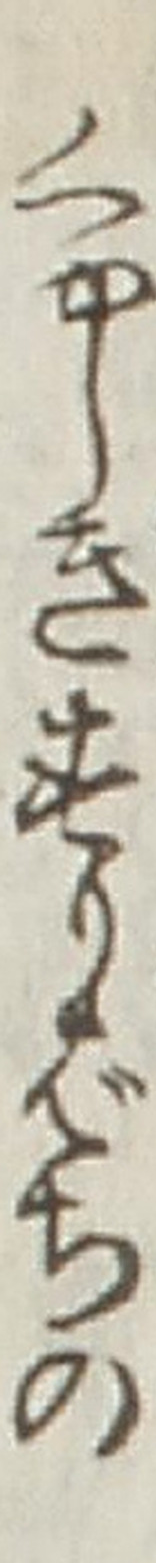くやしきすりばちの
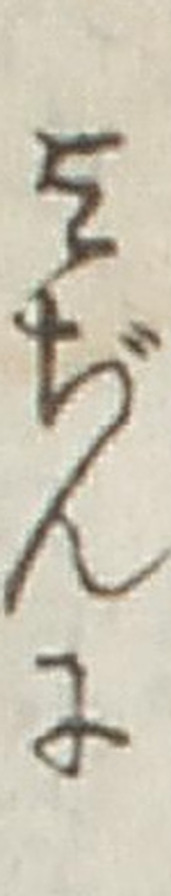みぢんに
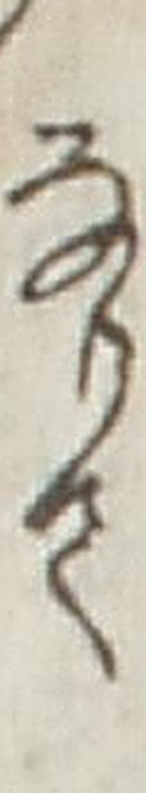なりて
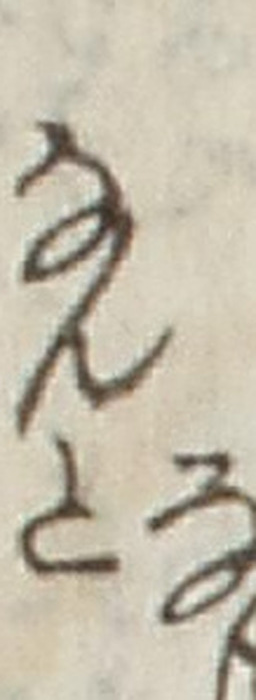なんと
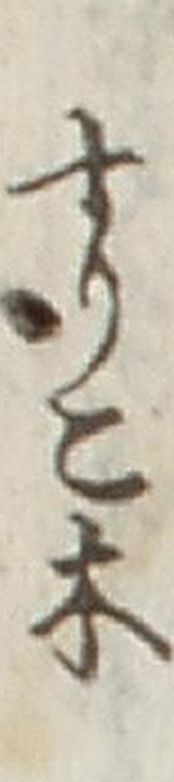すりこ木

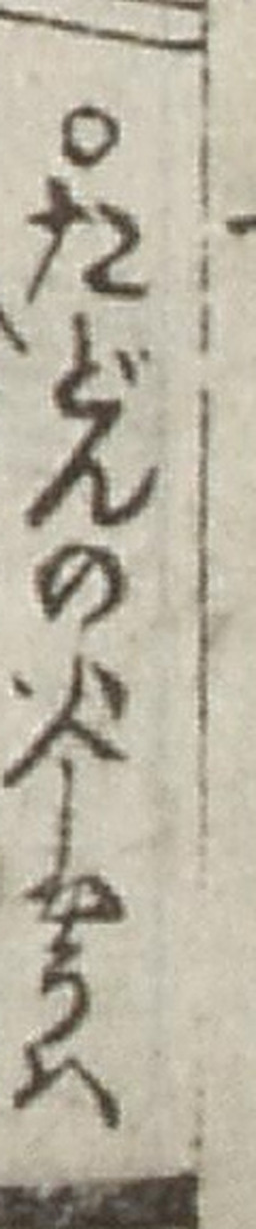○たどんの火しやうは
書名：三世相出雲當座帳　上下冊
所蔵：東京大学地震研究所図書室 Earthquake Research Institute Library, The University of Tokyo, JAPAN
